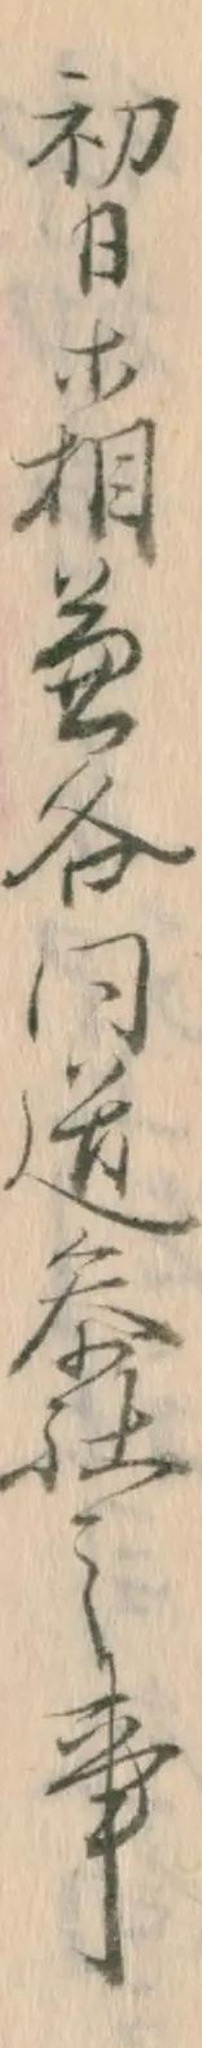初日等相兼各同道参社之事
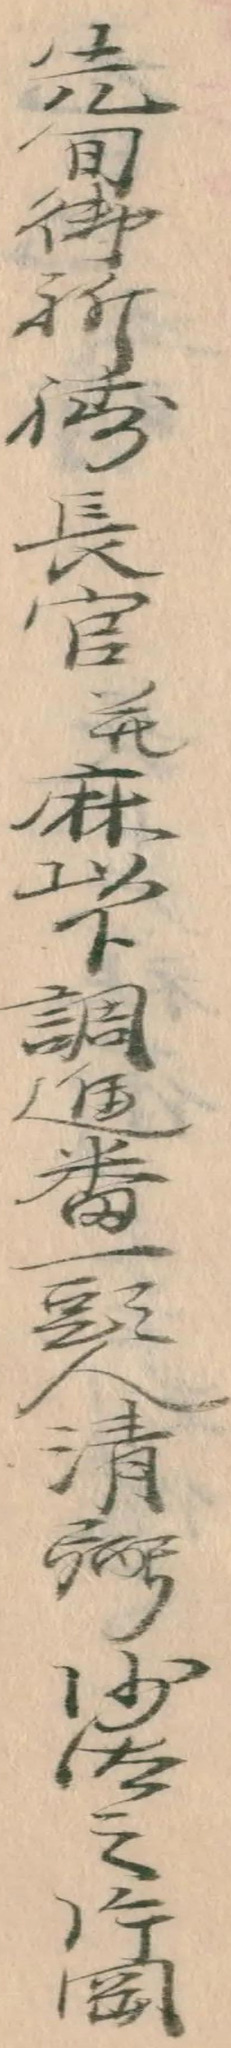先旬御祈祷長官并麻以下調進番一頭人清弼沙汰之片岡
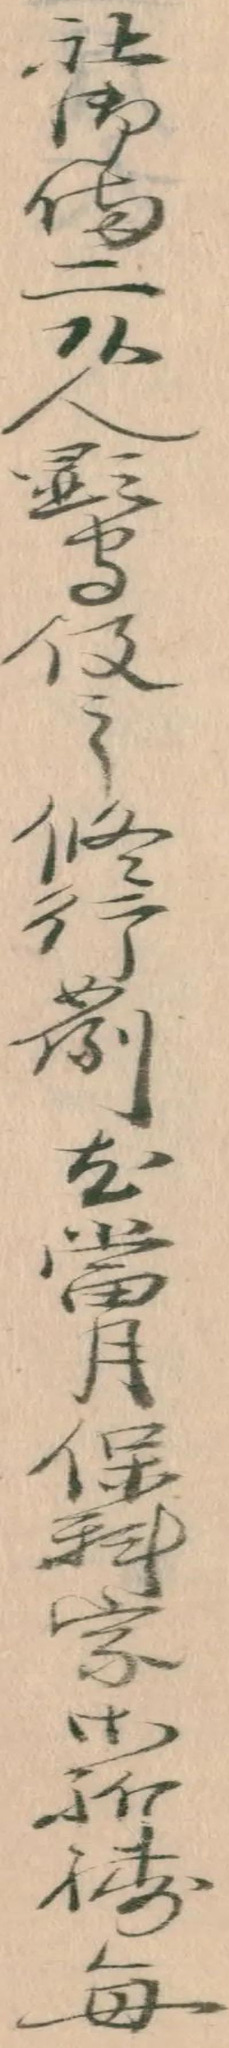社御備二頭人顕守役之修行如例尤當月保科家御祈祷毎
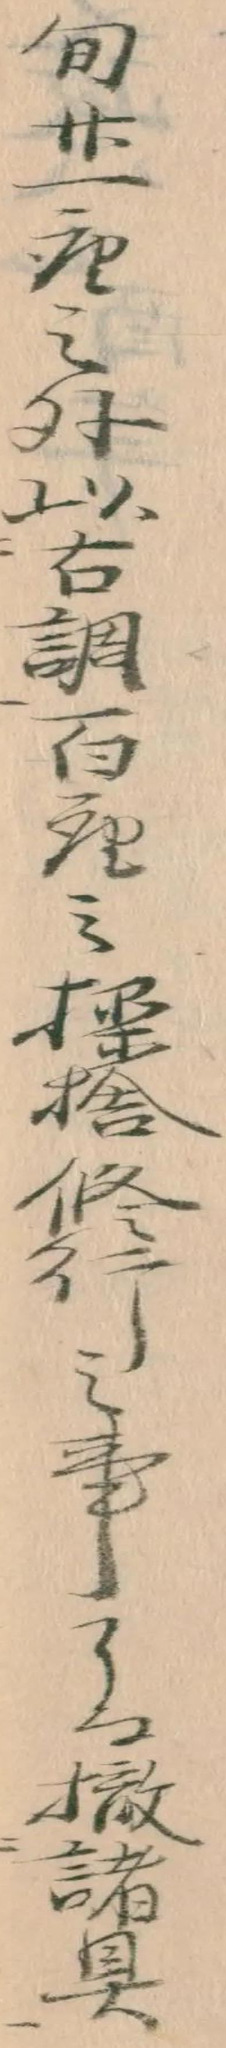旬廿一座之外以古調百座之操捨修行之事了而撒諸具
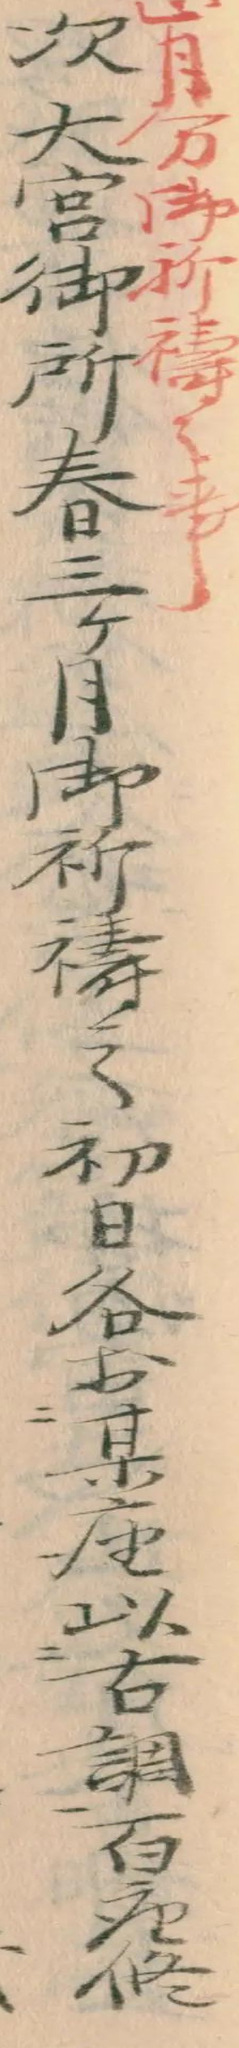次大宮御所春三ケ月御祈祷之初日各於某座以古調百座修
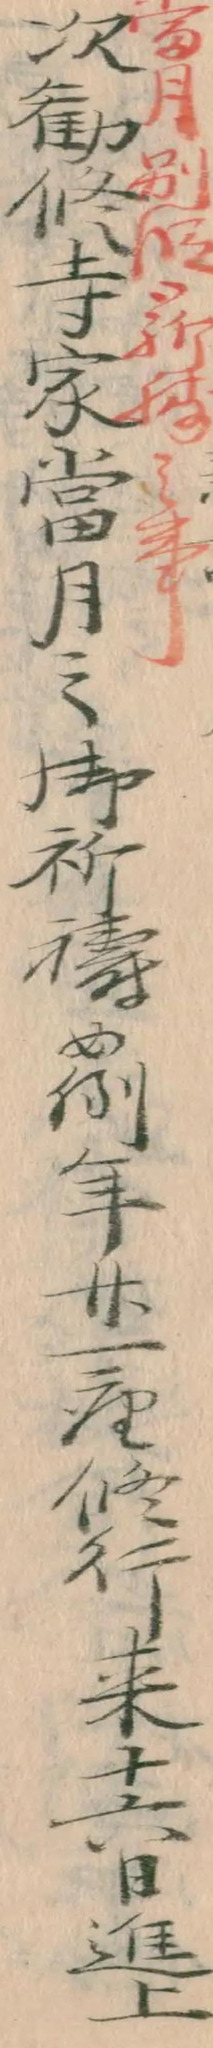次勧修寺家當月之御祈祷如例年廿一座修行来十六日進上
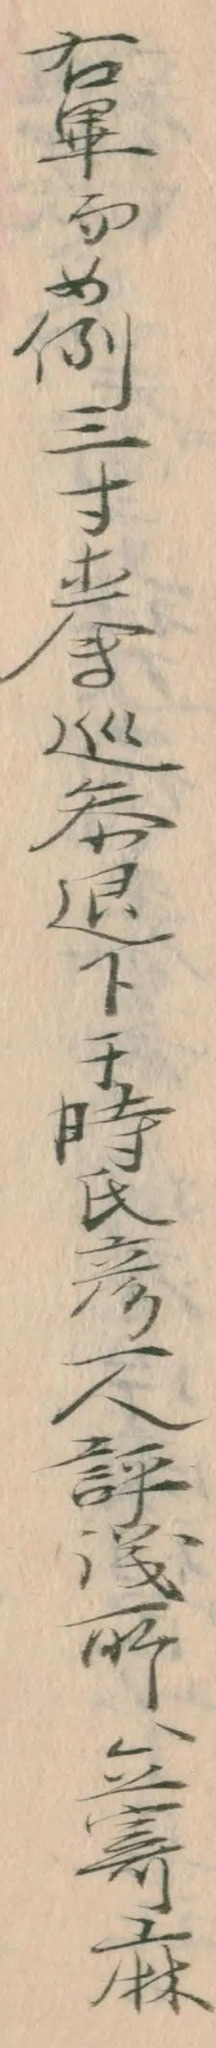右畢而如例三寸直會巡参退下于時氏彦一人評議所へ立寄麻
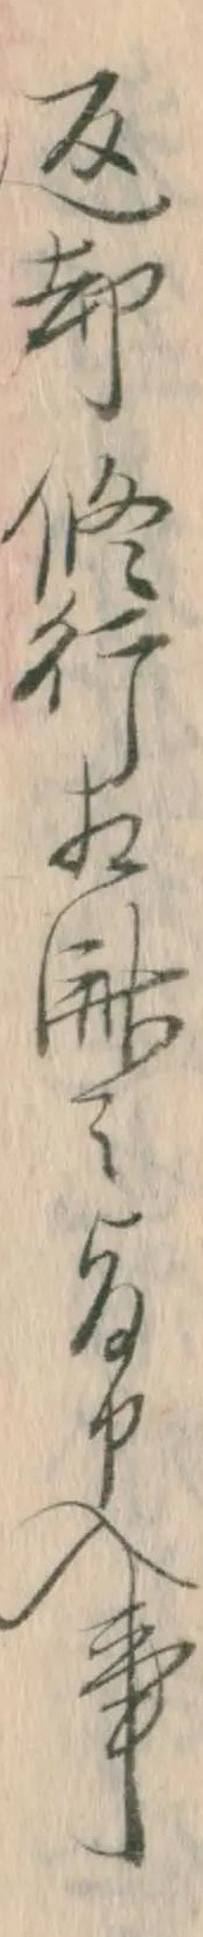返却修行相済之旨申入事
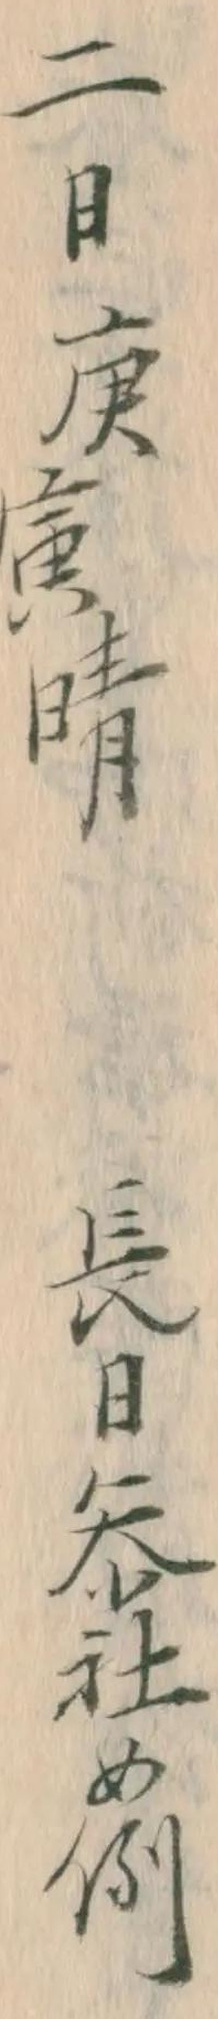二日庚午晴長日参社如例
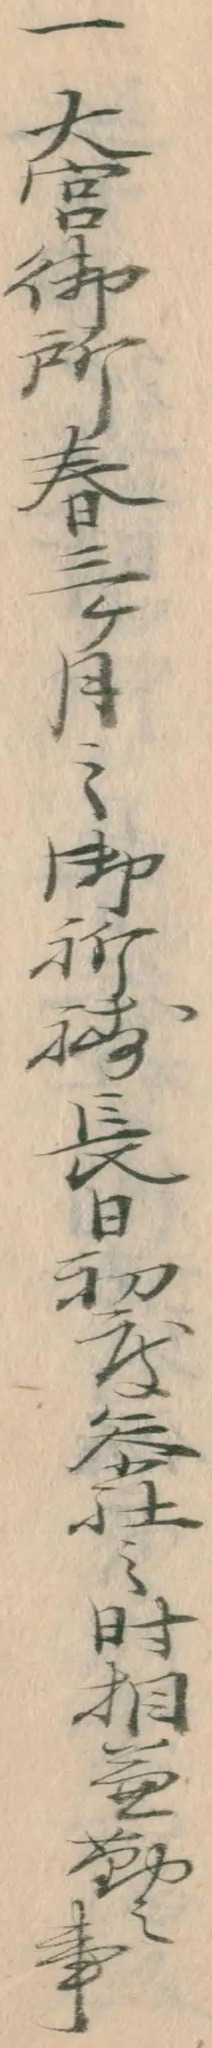一大宮御所春三ケ月之御祈祷長日初度参社之時相兼勤之事
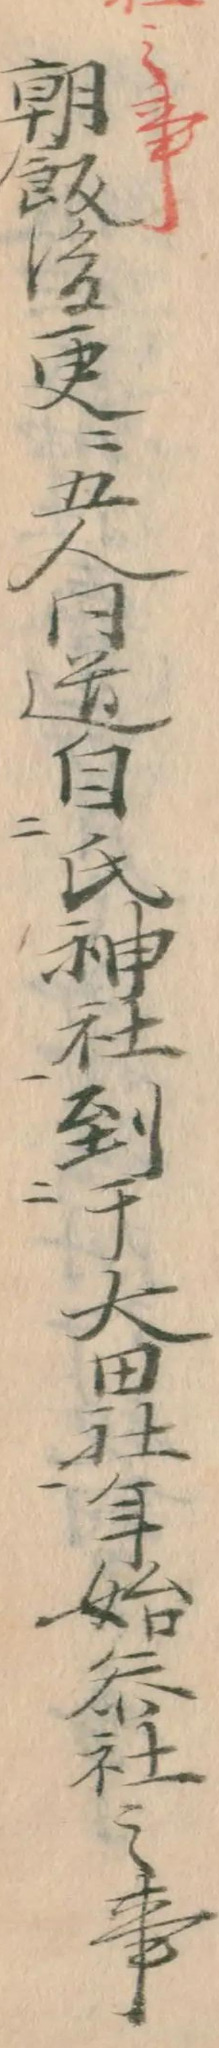一朝飯後更ニ五人同道自氏神社到于大田社年始参社之事

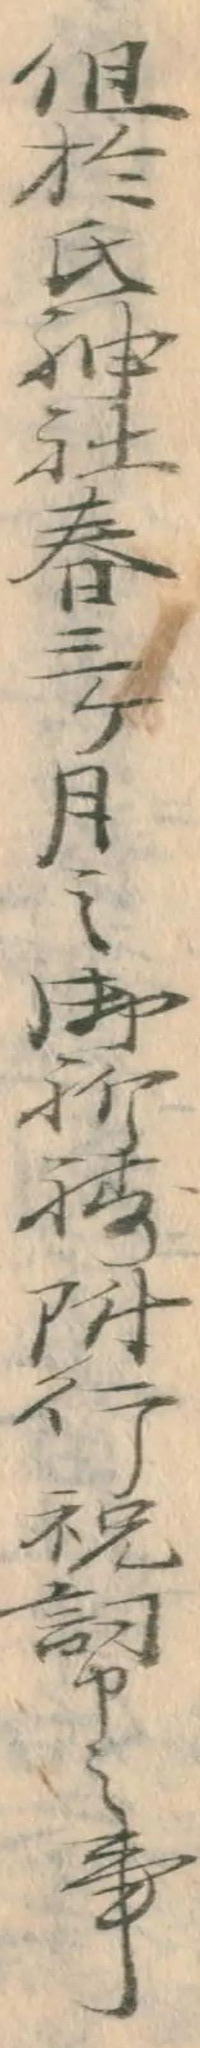但於氏神社春三ケ月之御祈祷附行祝詞申之事
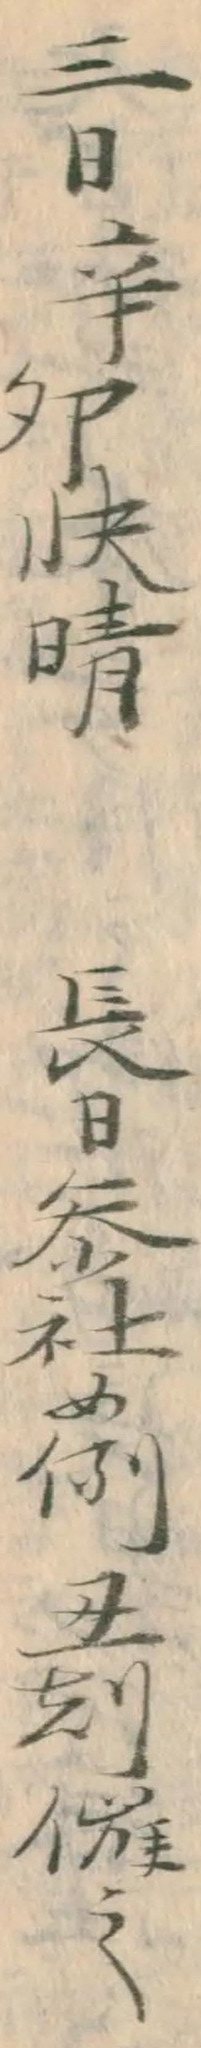三日辛卯快晴長日参社如例丑刻催之
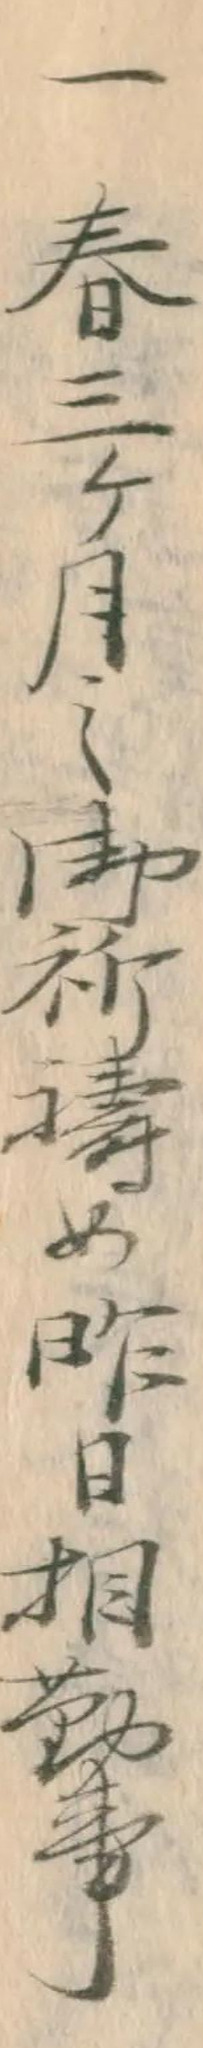一春三ヶ月之御祈祷如昨日相勤事
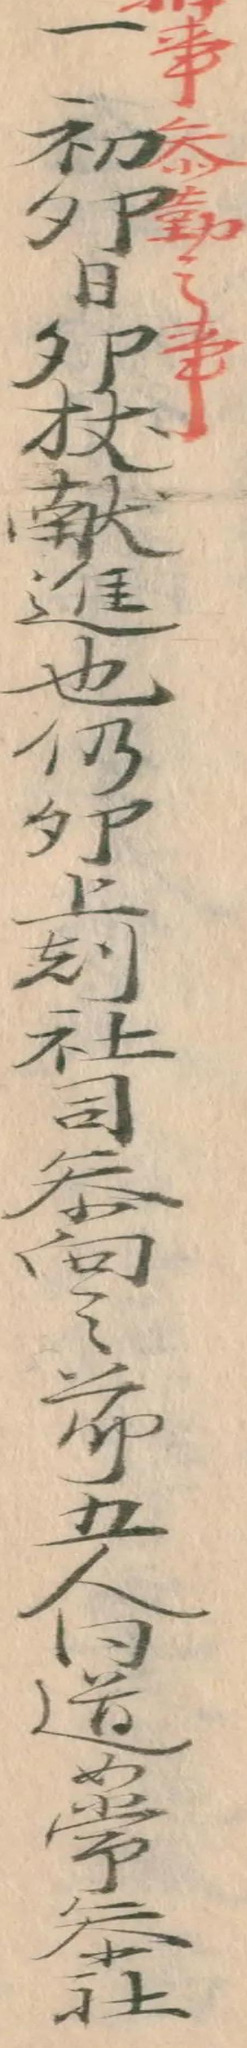一初卯日卯杖献進也仍卯上刻社司参向之節五人同道如常参社
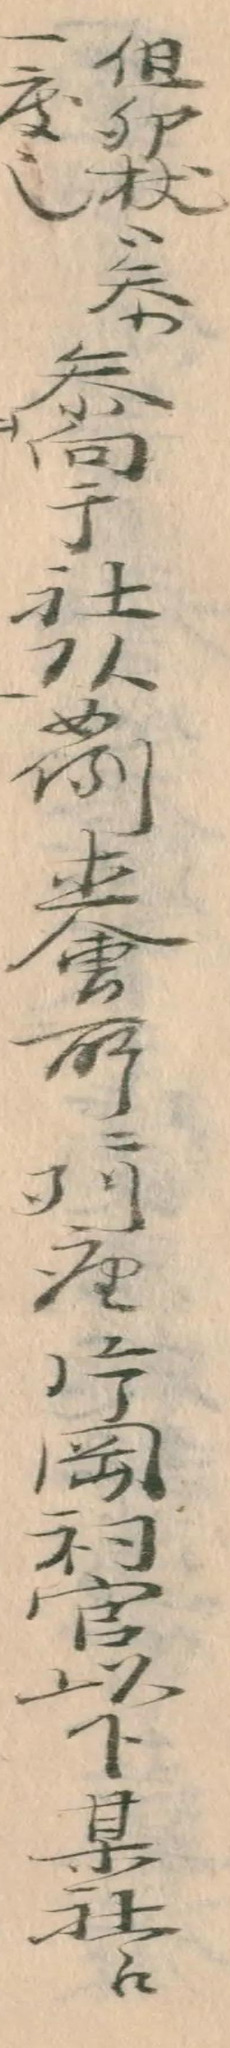但卯杖御参一度也参向于社頭如例直會所ニ列座片岡祠官以下某社え
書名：賀茂社記録. 第74冊
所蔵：国立国会図書館 National Diet Library, JAPAN
